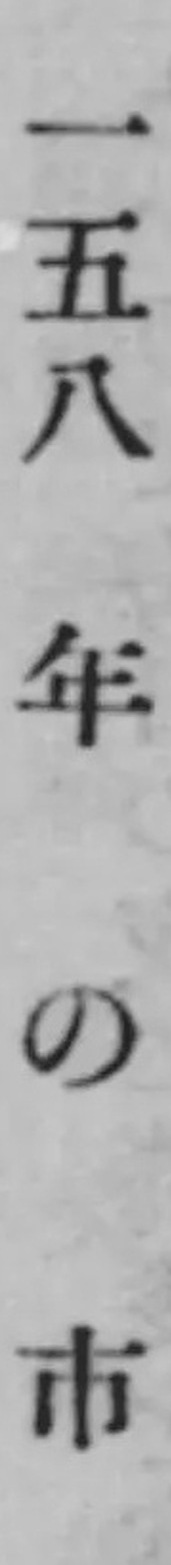一五八年の市
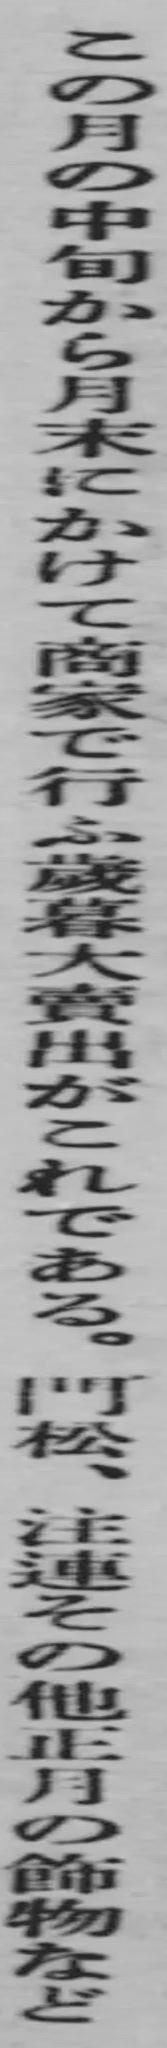この月の中旬から月末にかけて商家で行ふ歲暮大賣出がこれである。門松、注連その他正月の飾物など
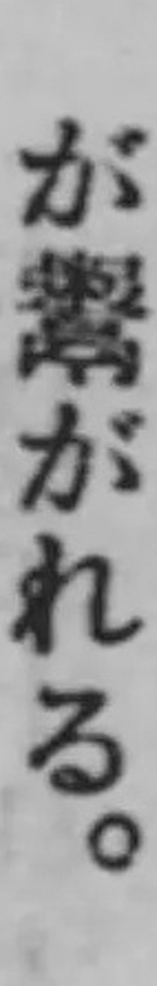が鬻がれる。
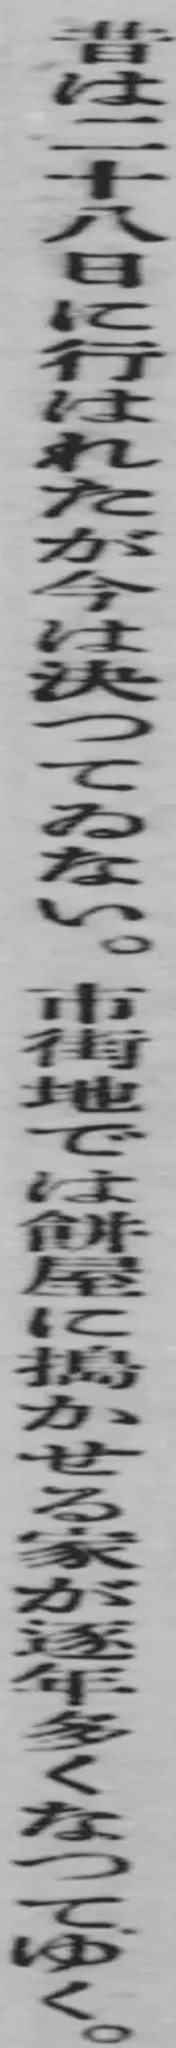昔は二十八日に行はれたが今は決つてゐない。市街地では餅屋に搗かせる家が逐年多くなつてゆく。

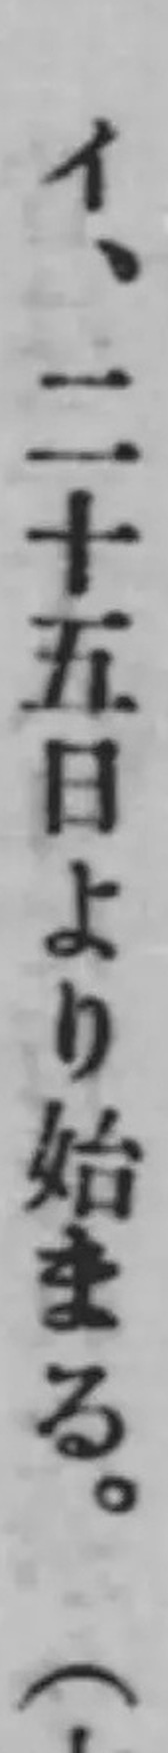イ、二十五日より始まる。(大崎)
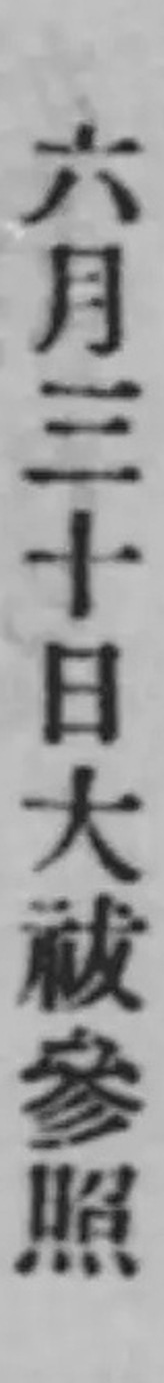六月三十日大祓參照
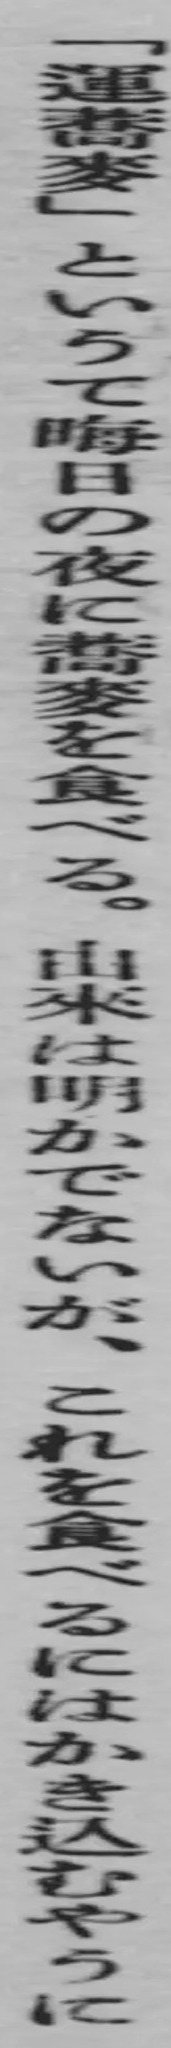「運蕎麥」というて晦日の夜に蕎麥を食べる。由來は明かでないが、これを食べるにはかき込むやうに
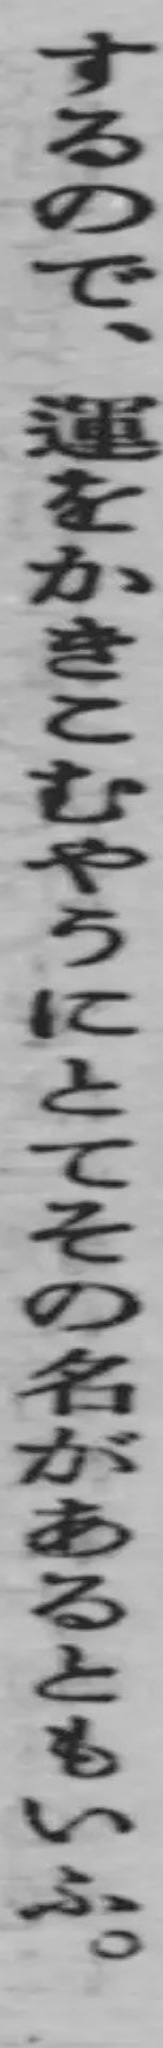するので、運をかきこむやうにとてその名があるともいふ。
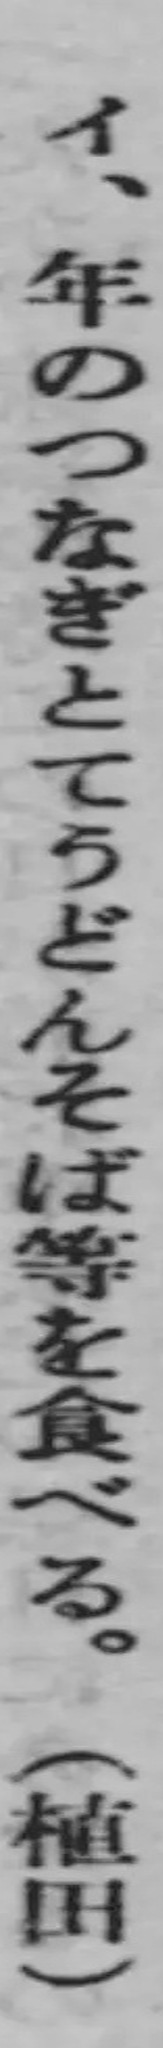イ、年のつなぎとてうどんそば等を食べる。(植田)
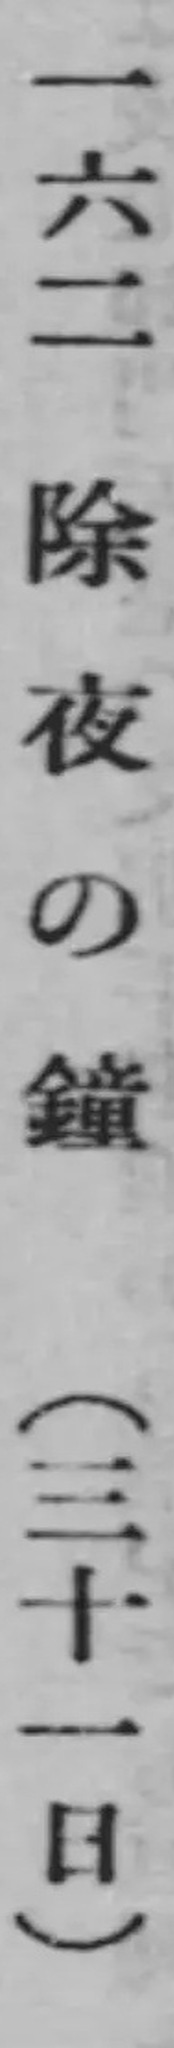一六二除夜の鐘(三十一日)
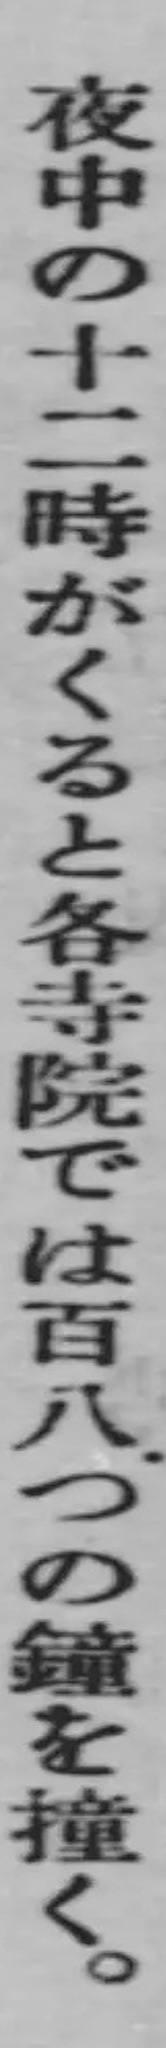夜中の十二時がくると各寺院では百八つの鐘を撞く。
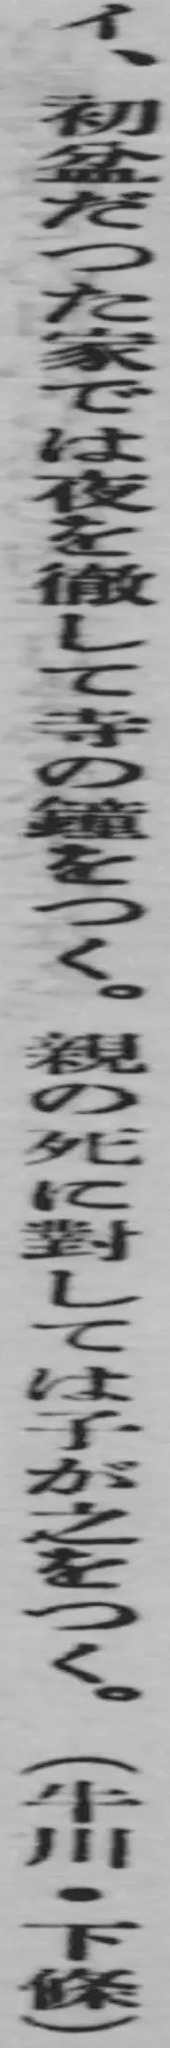イ、初盆だつた家では夜を徹して寺の鐘をつく。親の死に對しては子が之をつく。(牛川・下條)
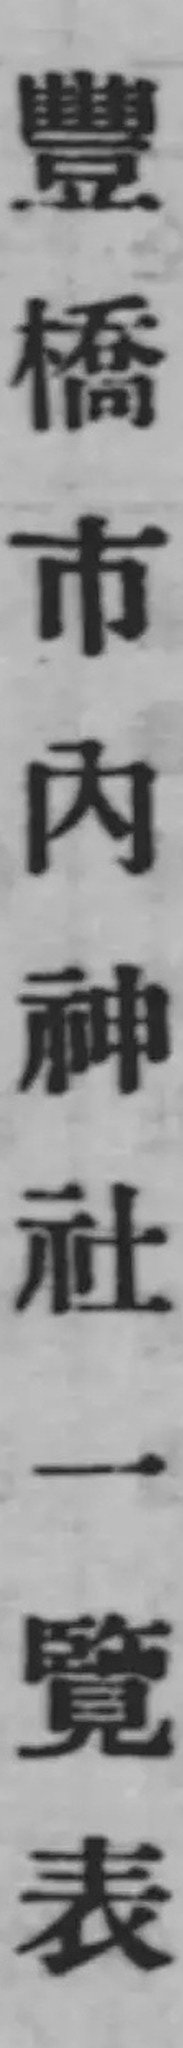豐橋市内神社一覽表

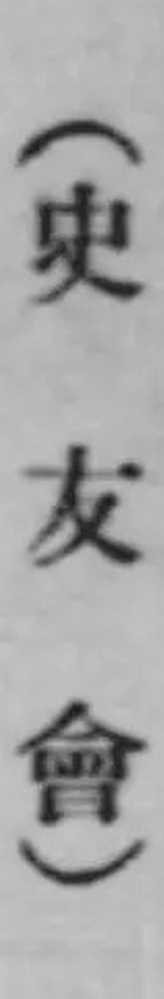(史友會)
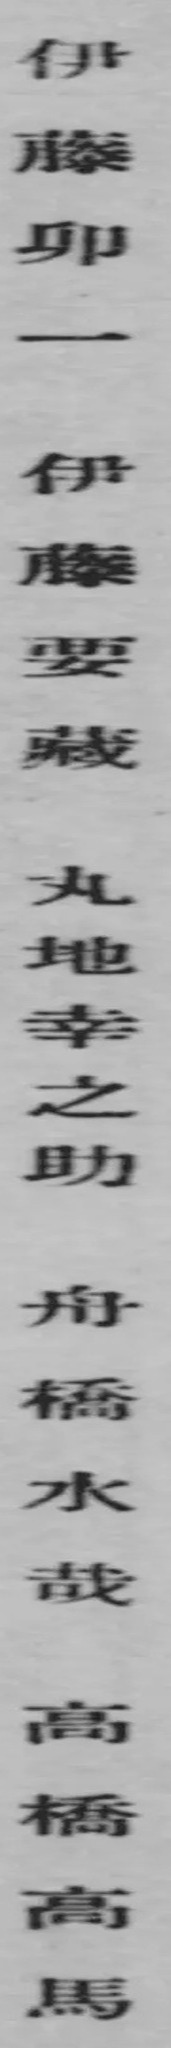伊藤卯一伊藤要藏丸地幸之助舟橋水哉高橋高馬
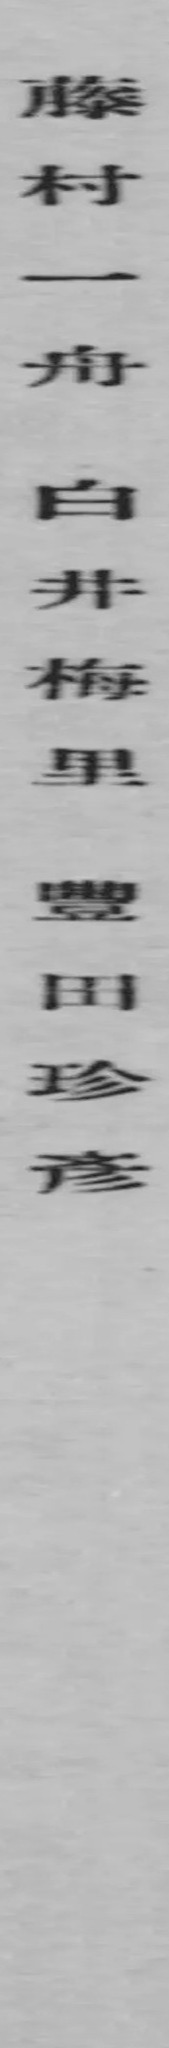藤村一舟白井梅里豐田珍彦
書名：豊橋の年中行事
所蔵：国立国会図書館 National Diet Library, JAPAN
